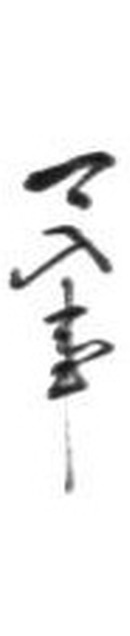可入事
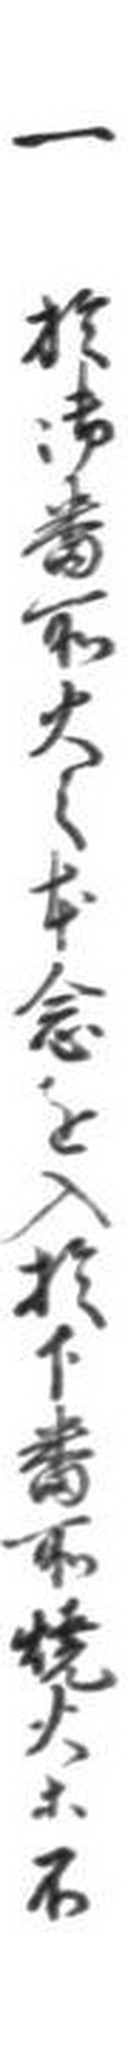一於御番所火之本念を入於下番所焼火等不

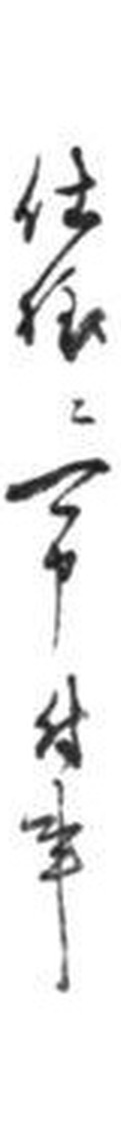仕様ニ可申付事
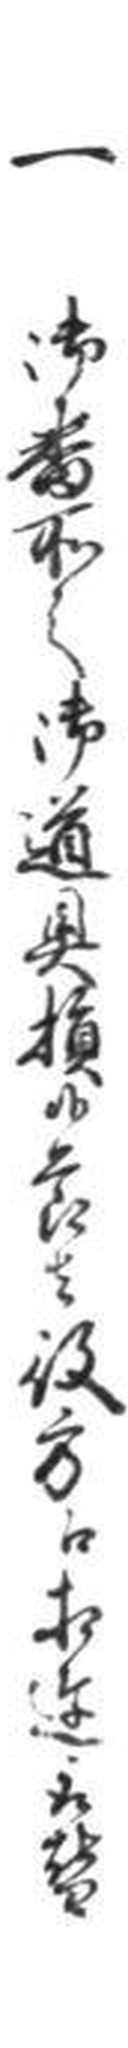一御番所之御道具損候節者役方江相達取替
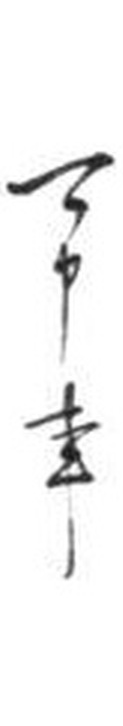可申事
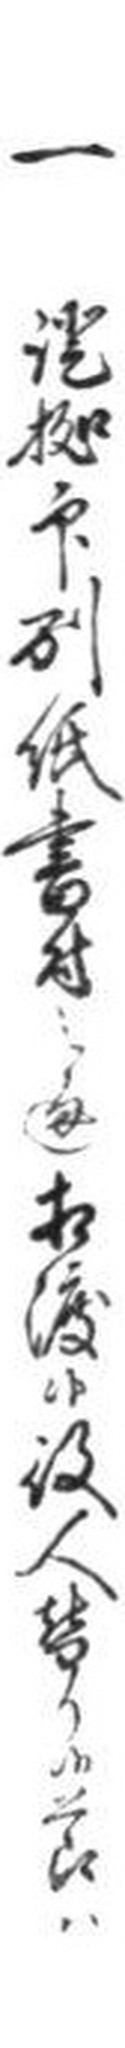一証拠印別紙書付之通相渡候役人替り候節ハ
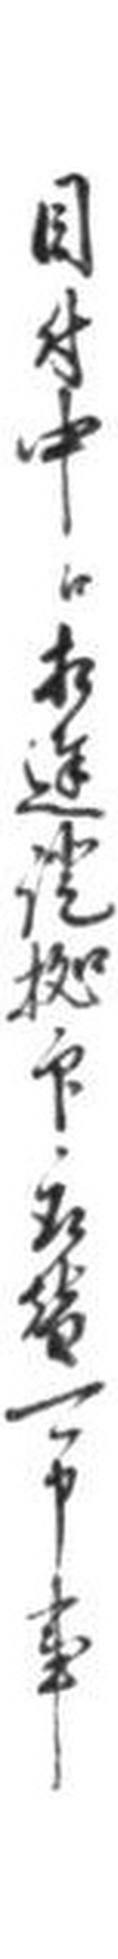目付中江相達証拠印取替可申事
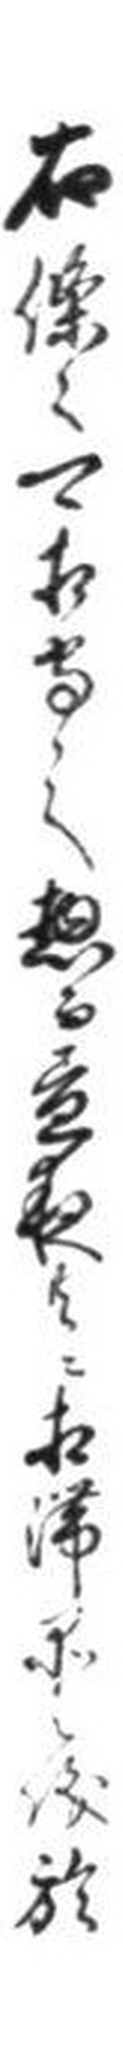右条々可相守之惣而昼夜共ニ相滞品之儀於
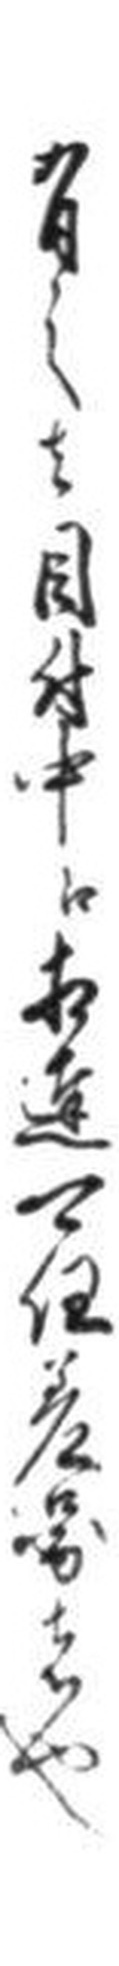有之者目付中江相達可任差図者也
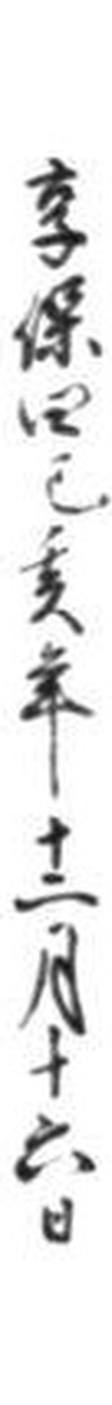享保四己亥年十二月十六日
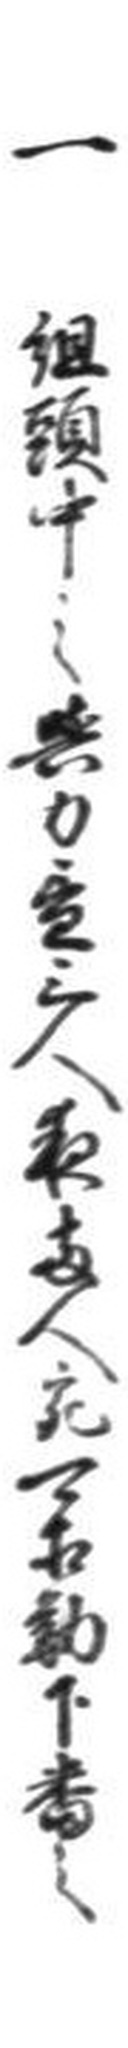一組頭中之与力昼三人夜両人宛可相勤下番之
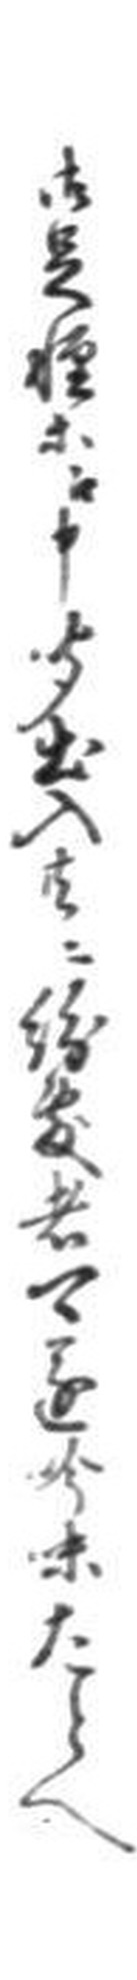御足軽等江申聞出入共ニ紛敷者可遂吟味たとへ
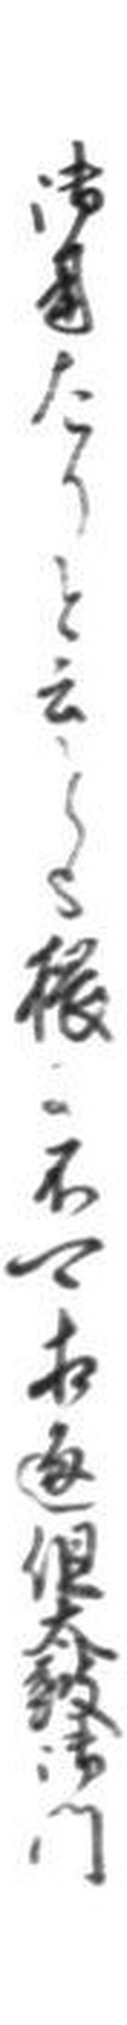御用たりと云とも猥に不可相通但太鼓御門
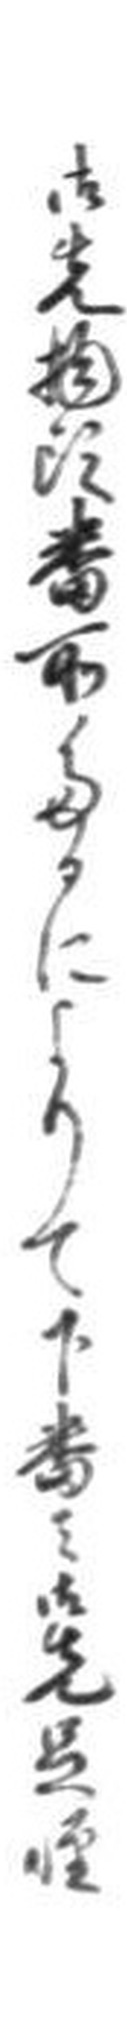御先物頭番所たるによりて下番者御先足軽
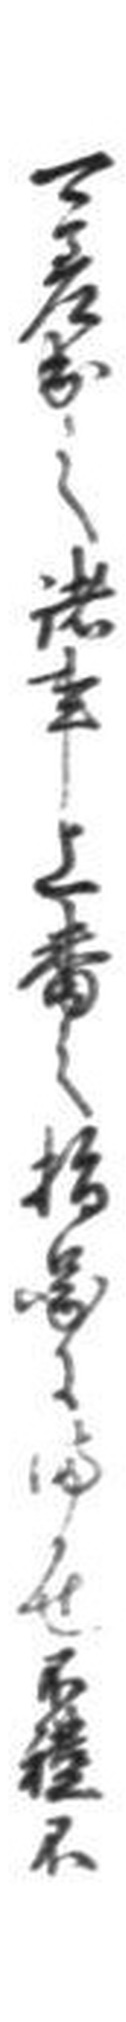可差出之諸事上番之指図にまかせ不礼不
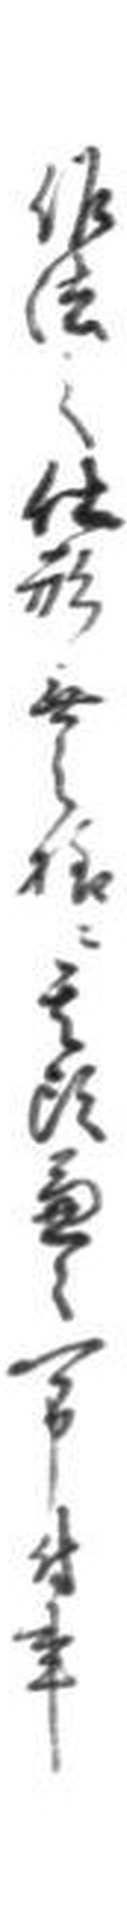作法之仕形無之様ニ其頭兼々可申付事
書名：家譜 三十三 吉邦公 享保四年
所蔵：福井県文書館 Fukui Prefectural Archives
